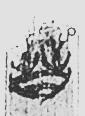晉
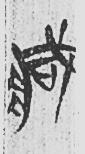戕
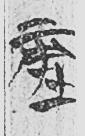坪
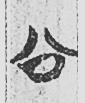公
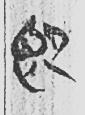即
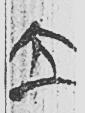立
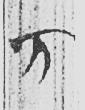兀
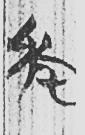年
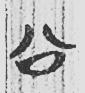公
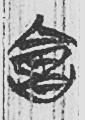會
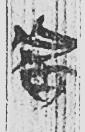者
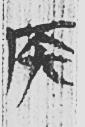侯
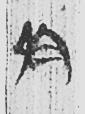於
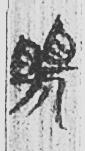瞁
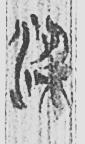梁
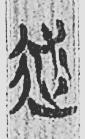述
